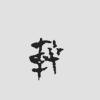{車矢}
